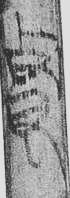貴
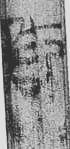唯
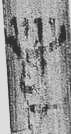○（一）
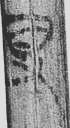○（得）
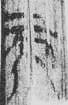而
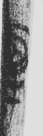解
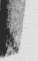之
